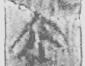六
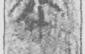十
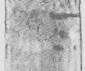三
